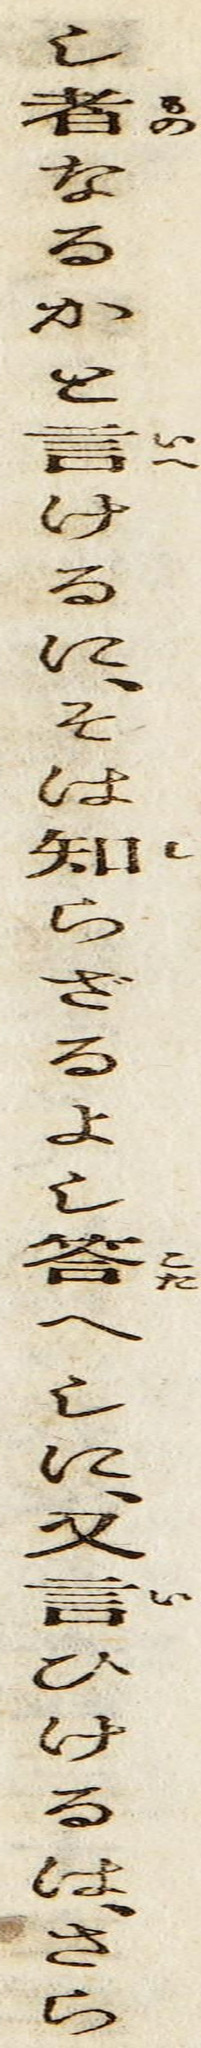し者なるかと言けるに、そは知らざるよし答へしに、又言ひけるは、さら
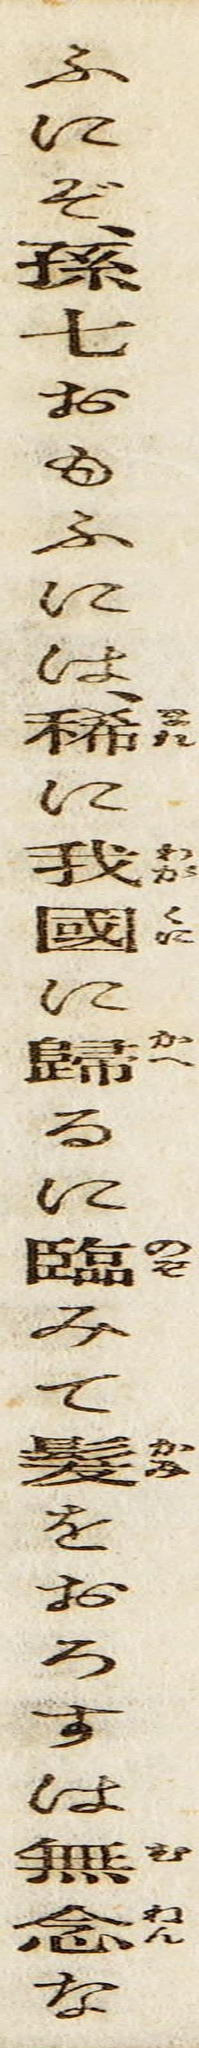ふにぞ、孫七おもふには、稀に我国に帰るに臨みて髪をおろすは無念な
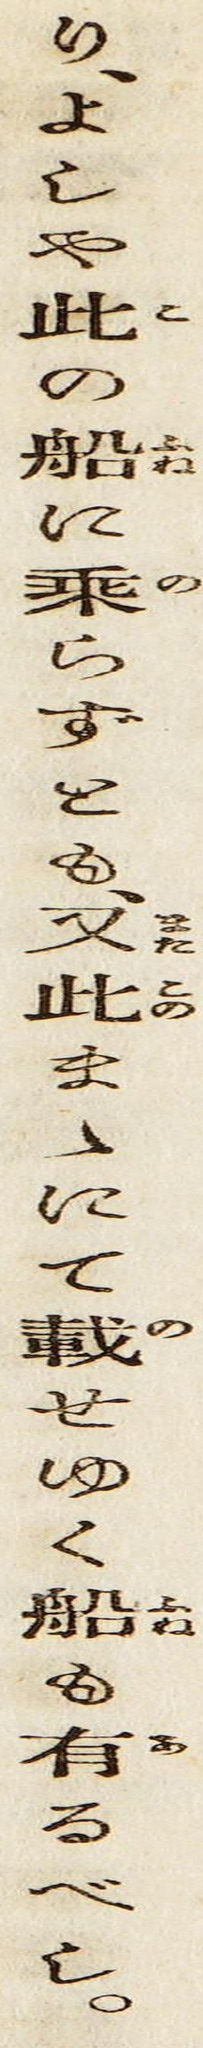り、よしや此の船に乗らずとも、又此まゝにて載せゆく船も有るべし。
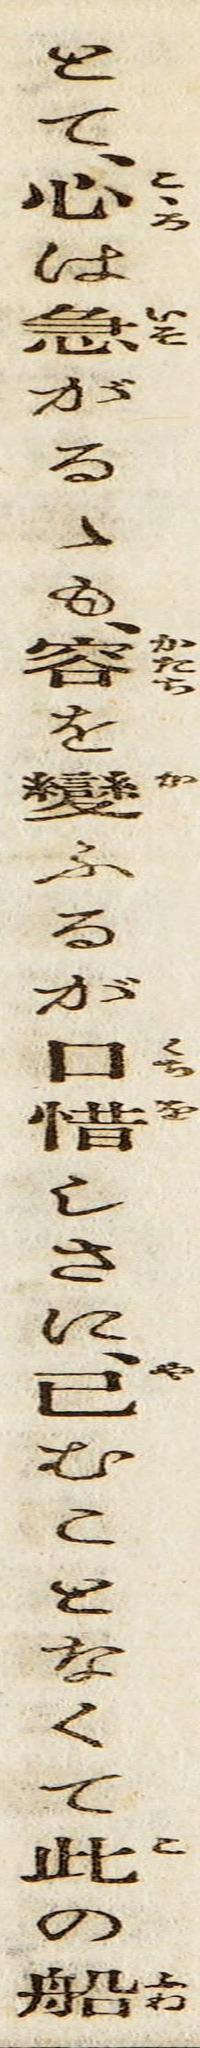とて、心は急がるゝも、容を変ふるが口惜しさに、已むことなくて此の船
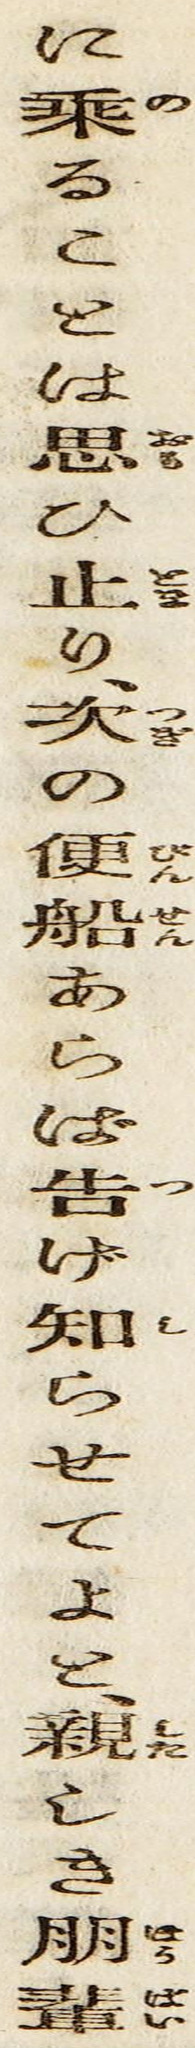に乗ることは思ひ止り、次の便船あらば告げ知らせてよと、親しき朋輩
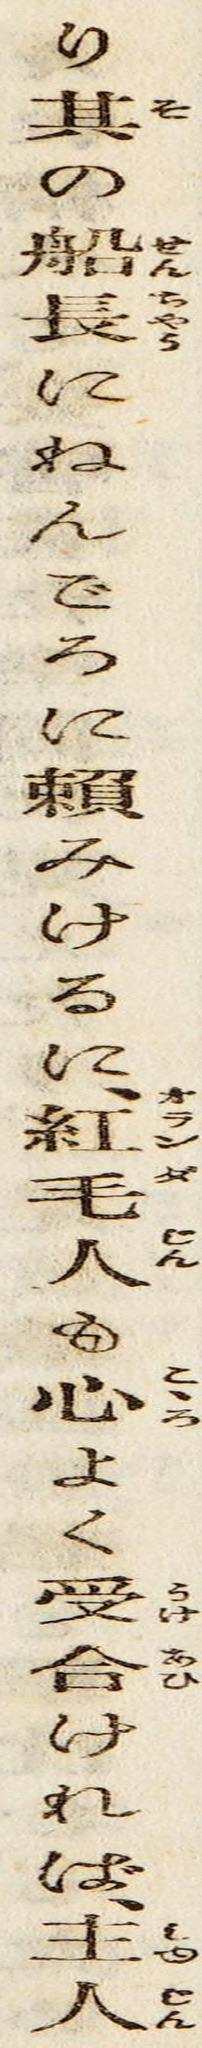り其の船長にねんごろに頼みけるに、紅毛人も心よく受合ければ、主人
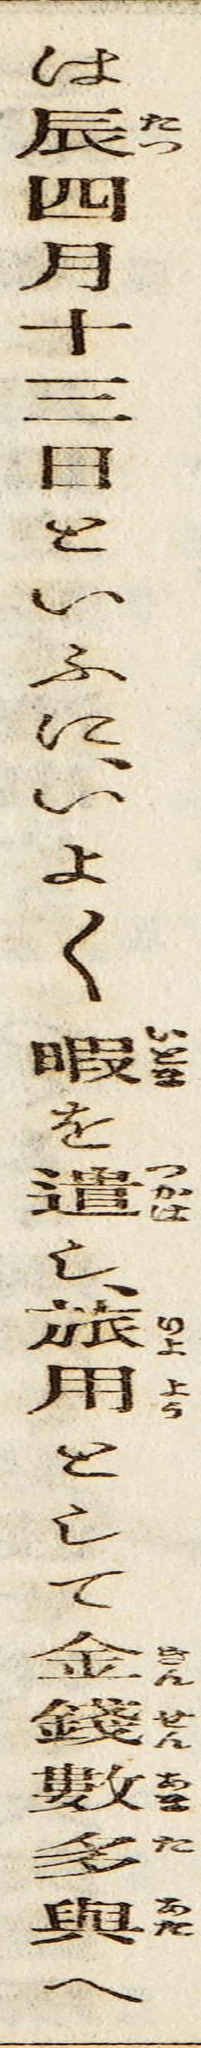は辰四月十三日といふに、いよ〳〵暇を遣し、旅用として金銭数多与へ
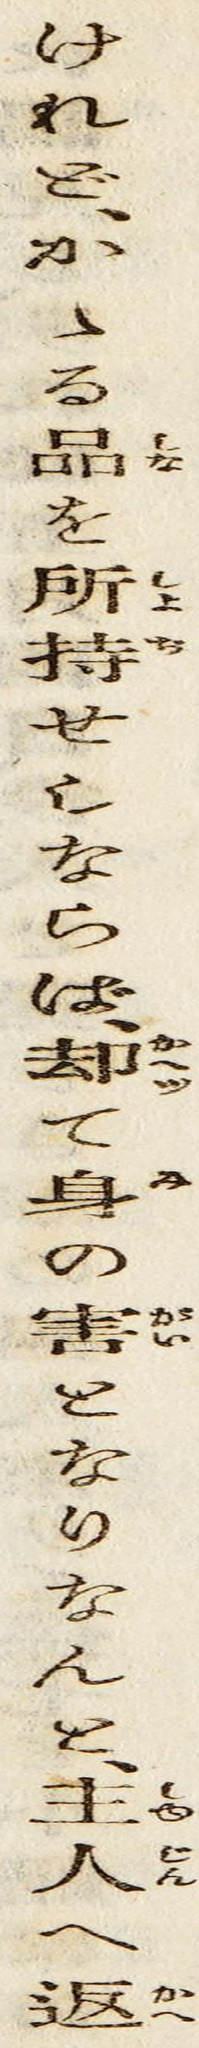けれど、かゝる品を所持せしならば、却て身の害となりなんと、主人へ返
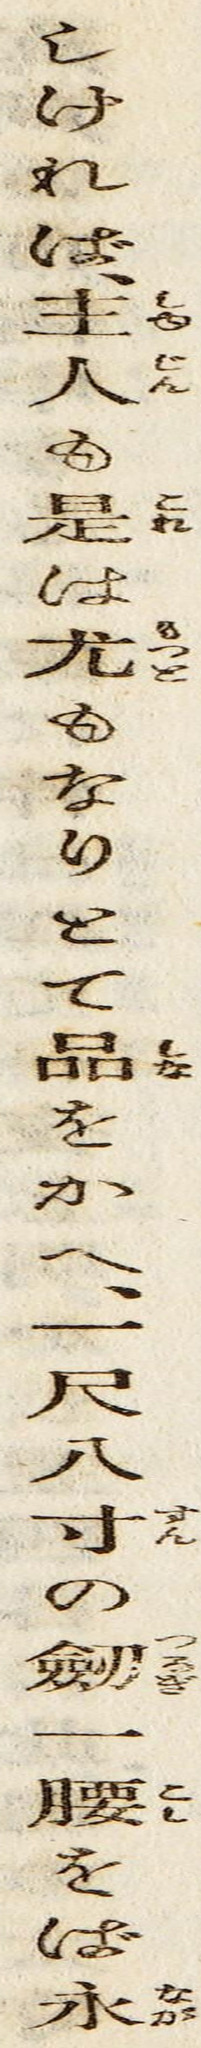しければ、主人も是は尤もなりとて品をかへ、一尺八寸の剣一腰をば永
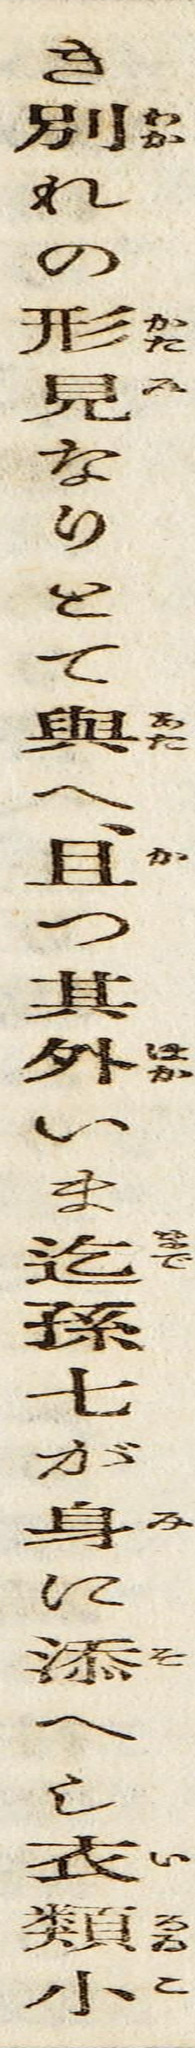き別れの形見なりとて与へ、且つ其外いま迄孫七が身に添へし衣類小
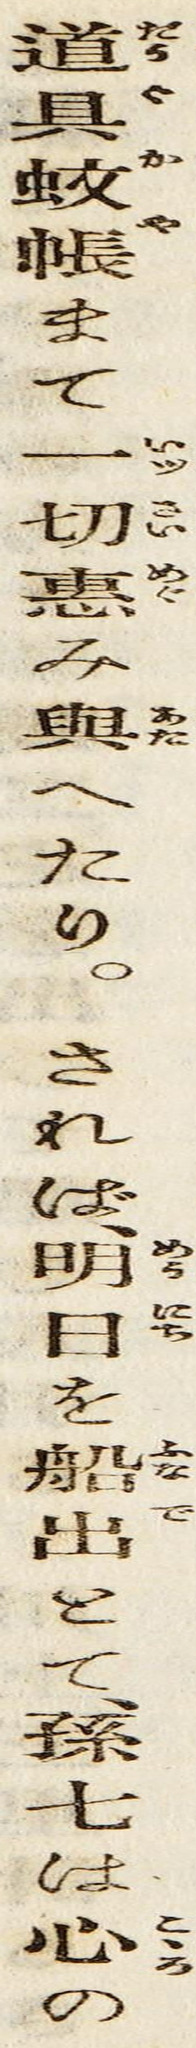道具蚊帳まて一切恵み与へたり。されば、明日を船出とて、孫七は心の
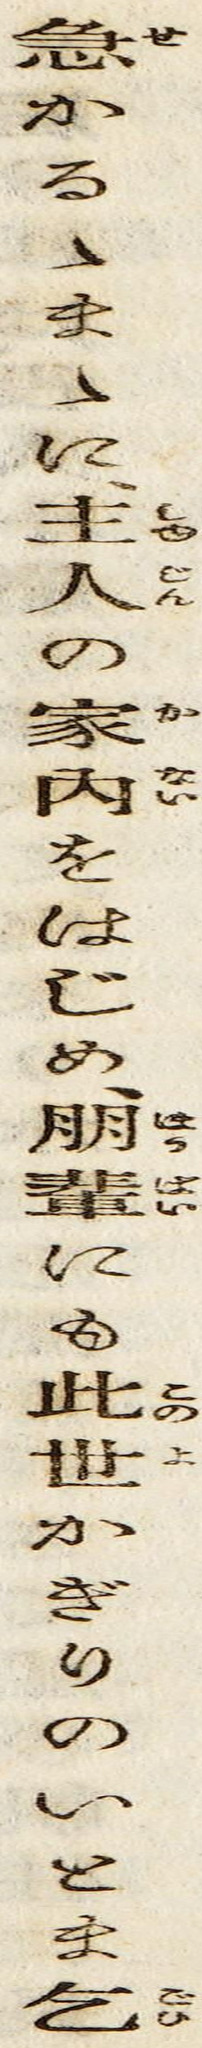急かるゝまゝに、主人の家内をはじめ、朋輩にも此世かぎりのいとま乞
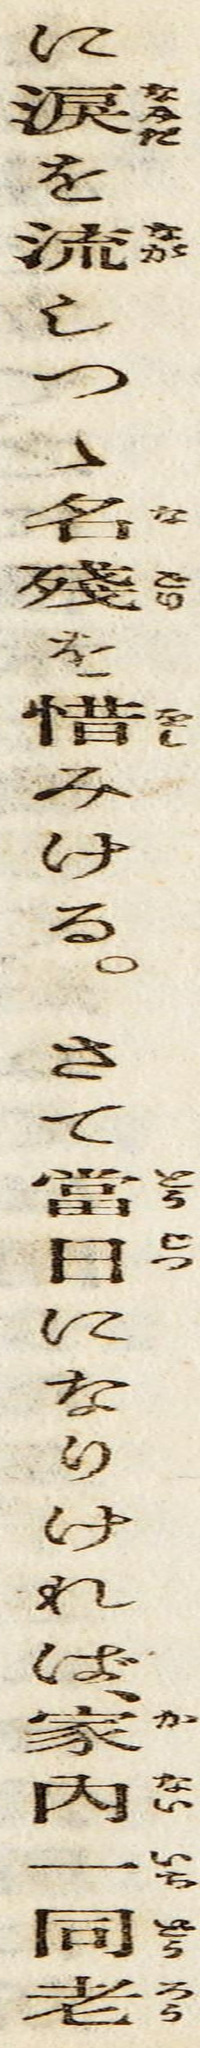に涙を流しつゝ名残を惜みける。さて当日になりければ、家内一同老
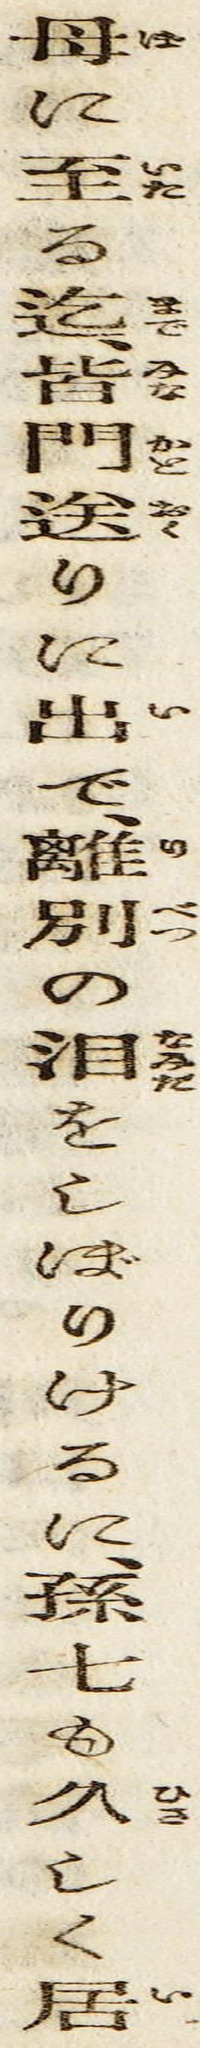母に至る迄、皆門送りに出で、離別の泪をしぼりけるに、孫七も久しく居
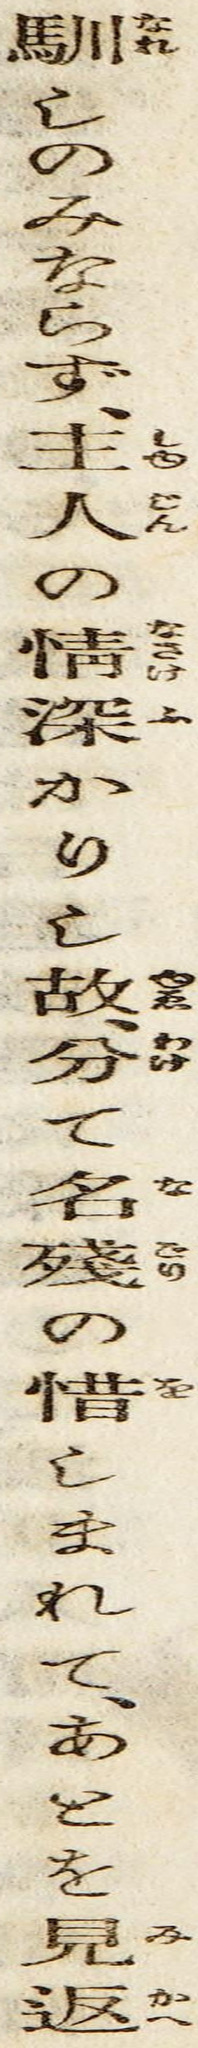馴しのみならず、主人の情深ふかりし故、分て名残の惜しまれて、あとを見返
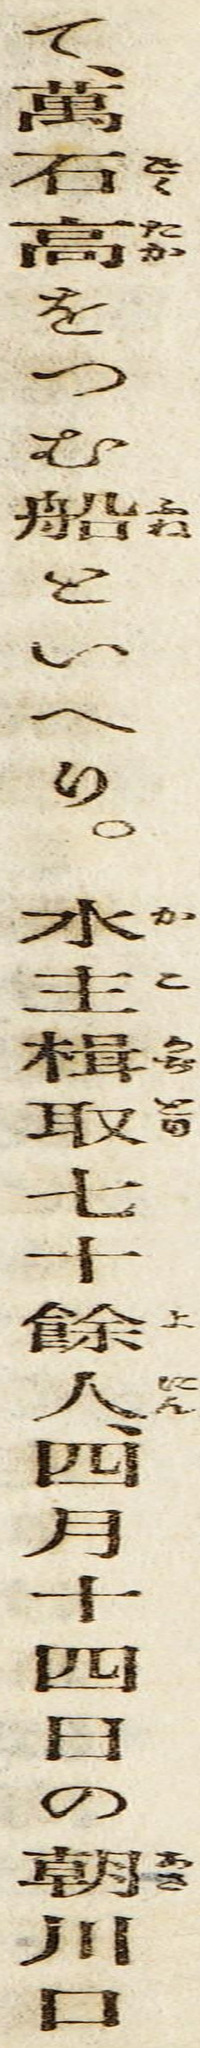て、万石高をつむ船といへり。水主楫取七十余人、四月十四日の朝川口
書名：日本漂流譚
